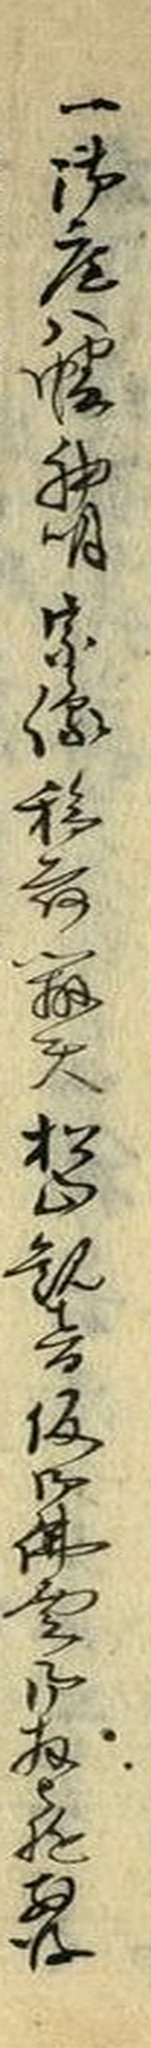一御庭八幡神明宗像稲荷弁天松山観音仮御仏殿御拝被遊前後
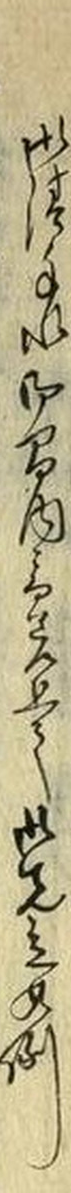御清手水御間内ニ而差上之御先立如例
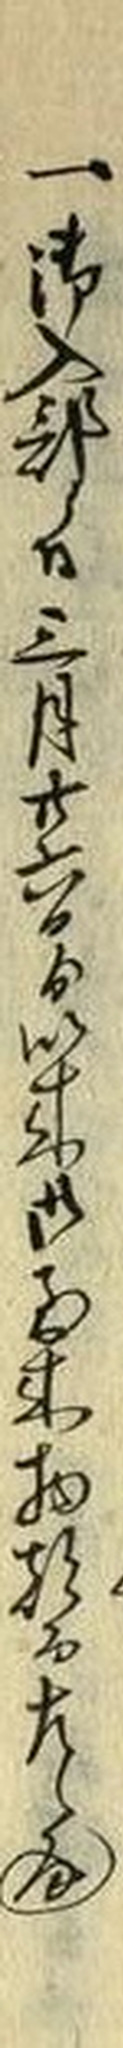一御入部ニ付三月廿六日ゟ以来御到来物都而左之通
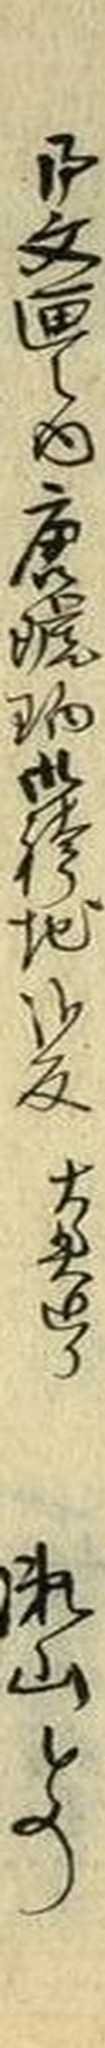御文匣之内唐琥珀御袴地弐反大奥廻り瀬山との
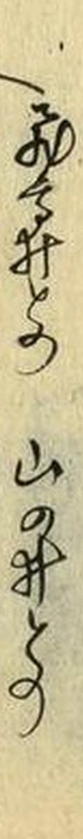飛鳥井との山の井との
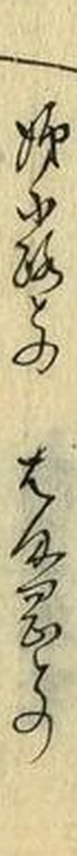姉小路とのはま岡との
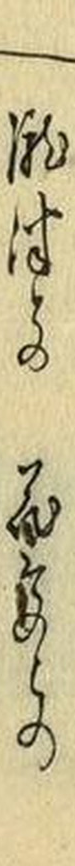瀧津との花そのとの
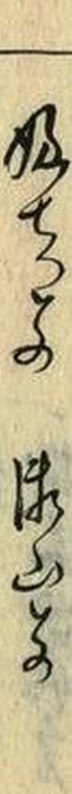ふちとの瀬山との
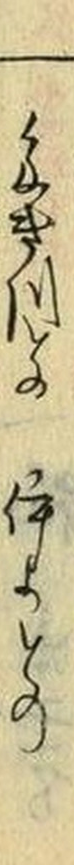たき川とのいよとの
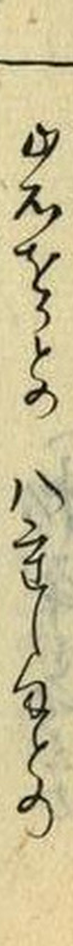岩をかとの八重しまとの
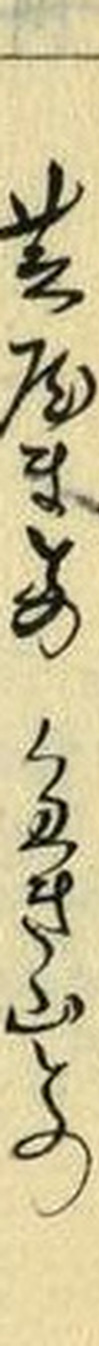芝やまとのたき山との
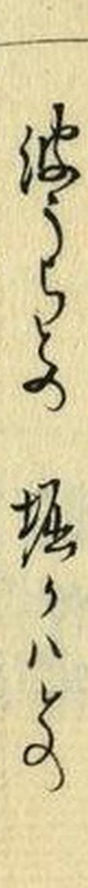波うらとの堀かハとの
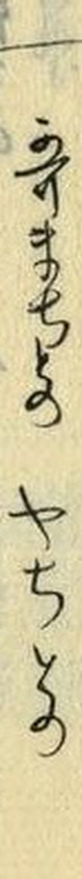哥まちとのやちとの
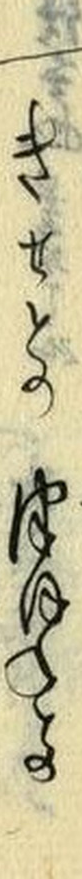きせとのつほねとの
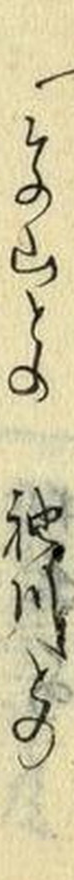その山との袖川との
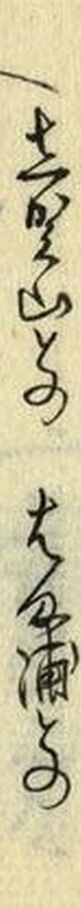志賀山とのはま浦との
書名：少傅日録抄（斉善付側向頭取日記、江戸并道中、初入在国、逝去後…
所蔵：福井県文書館 Fukui Prefectural Archives
